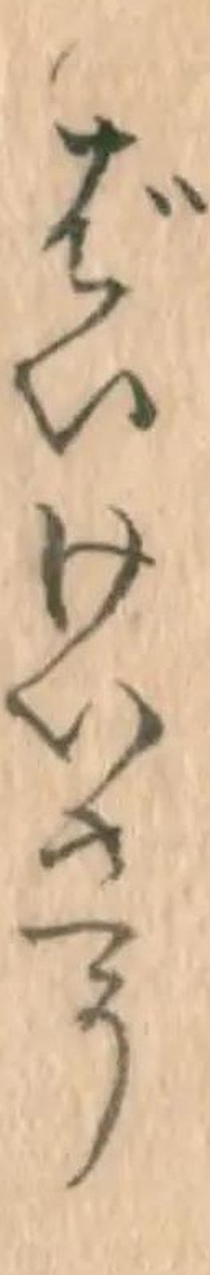ばいけいさう

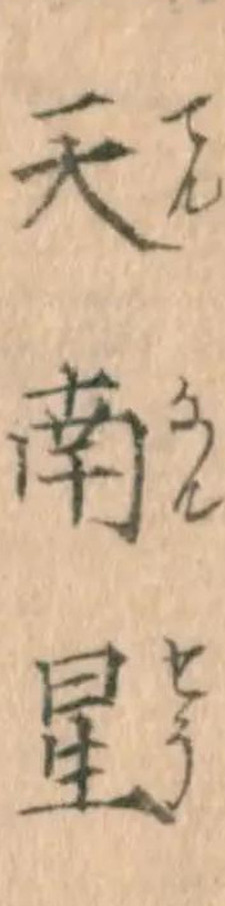天南星
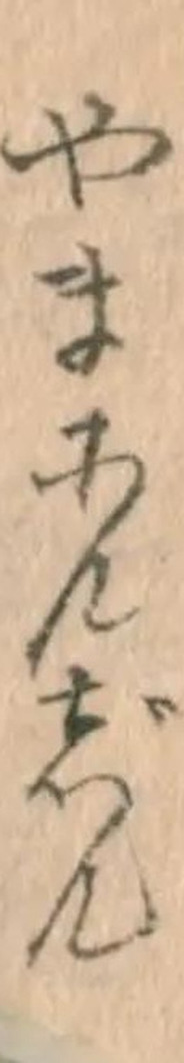やまにんじん
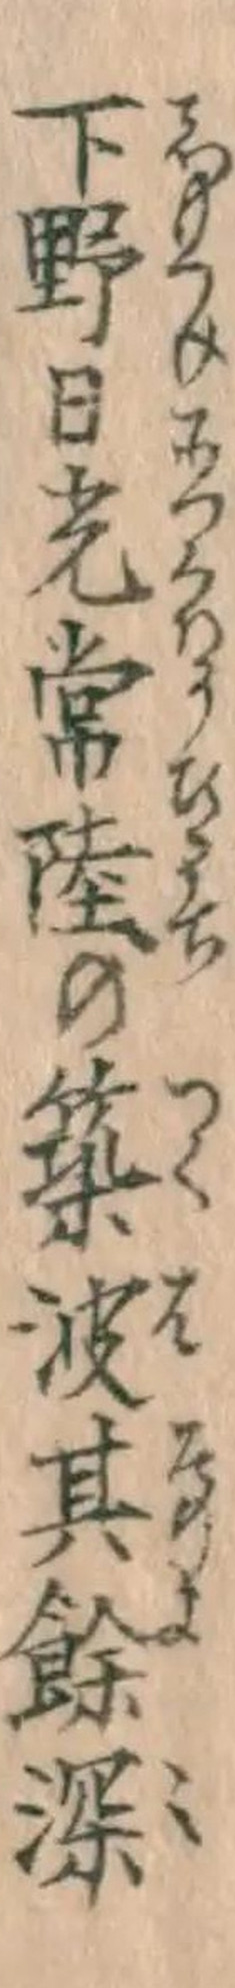下野日光常陸の築波其余深
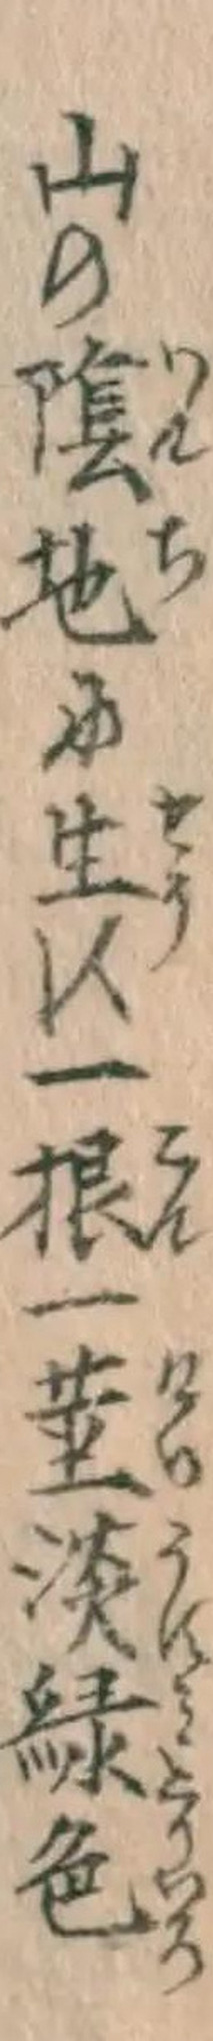山の陰地に生す一根一茎淡緑色
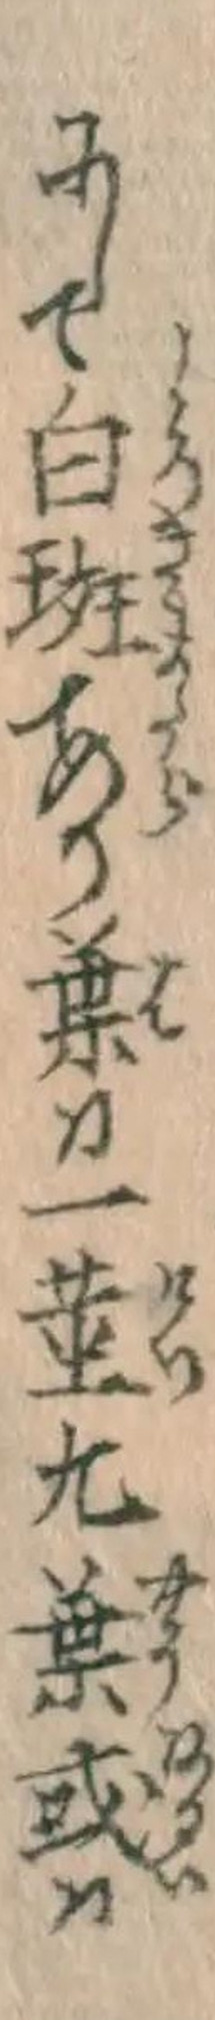にして白斑あり葉は一茎九葉或は
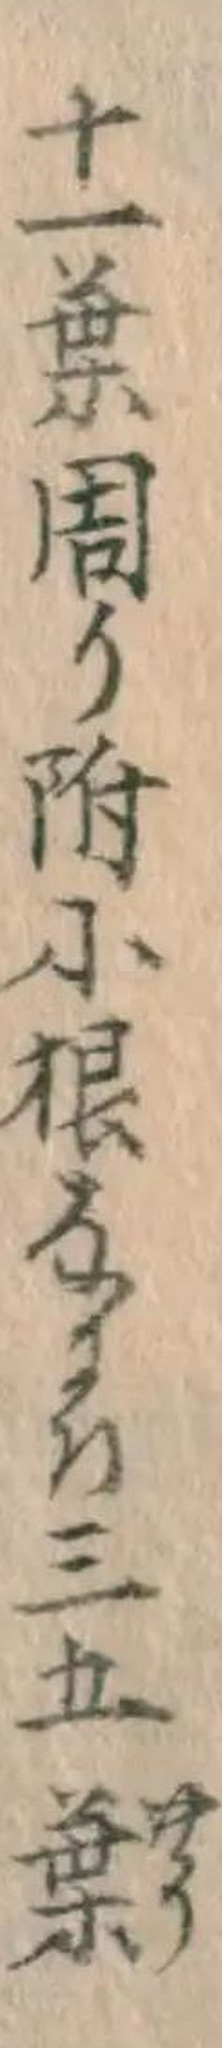十一葉周り附小根なるは三五葉
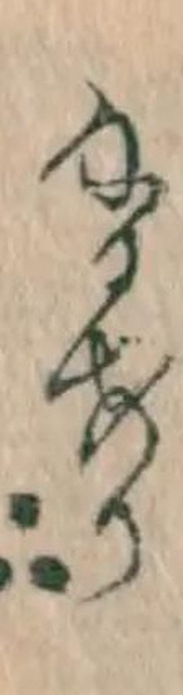なるあり
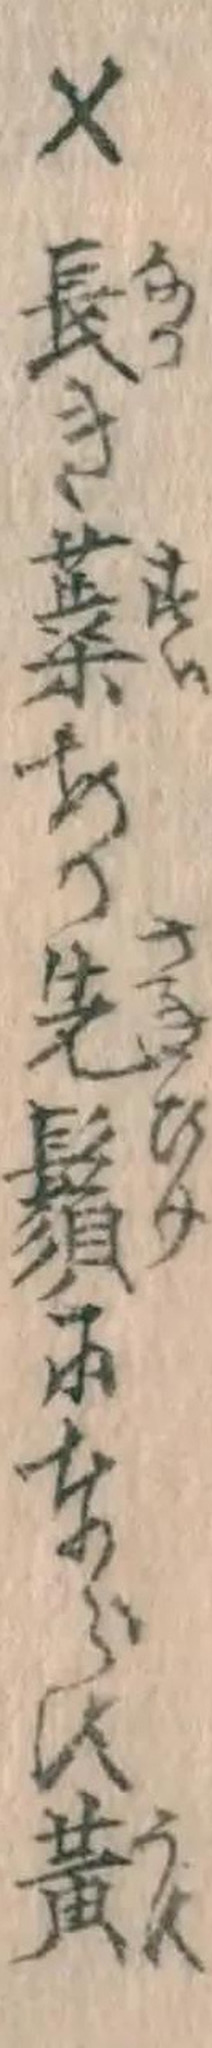×長き蘂あり先鬚にならす黄
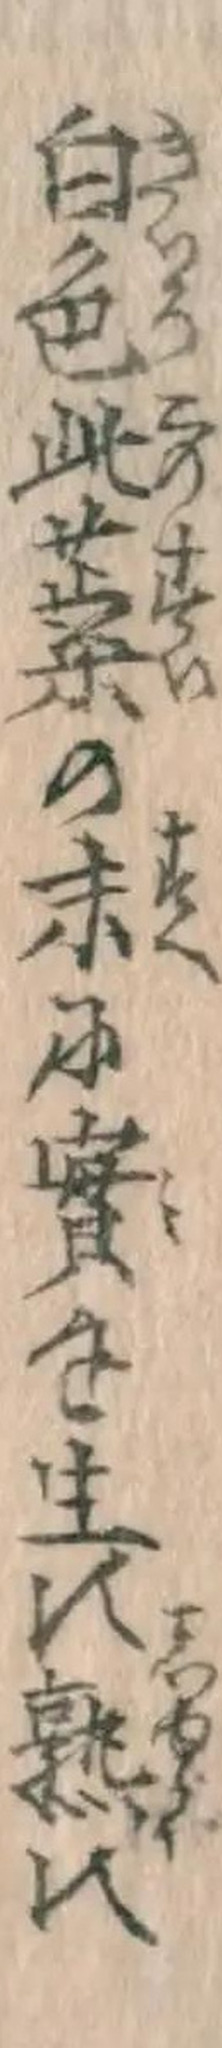白色此蘂の末に実を生す熟す
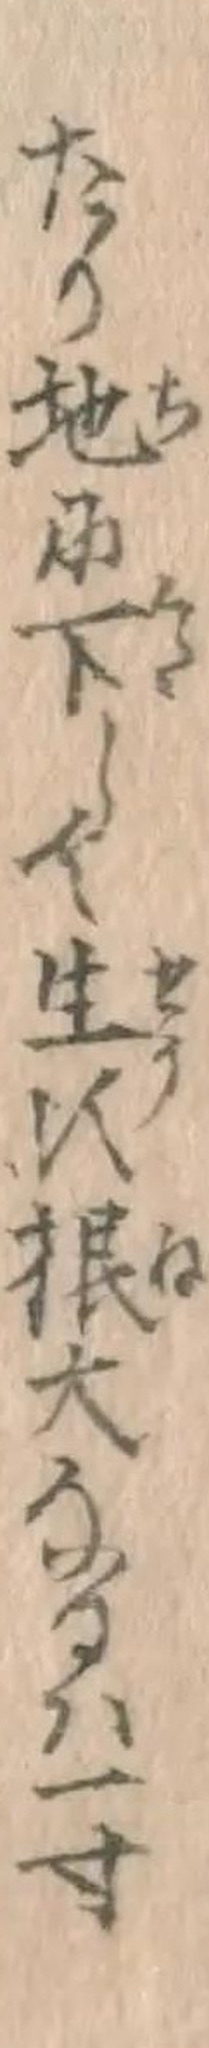たり地に下して生す根大なるは一寸
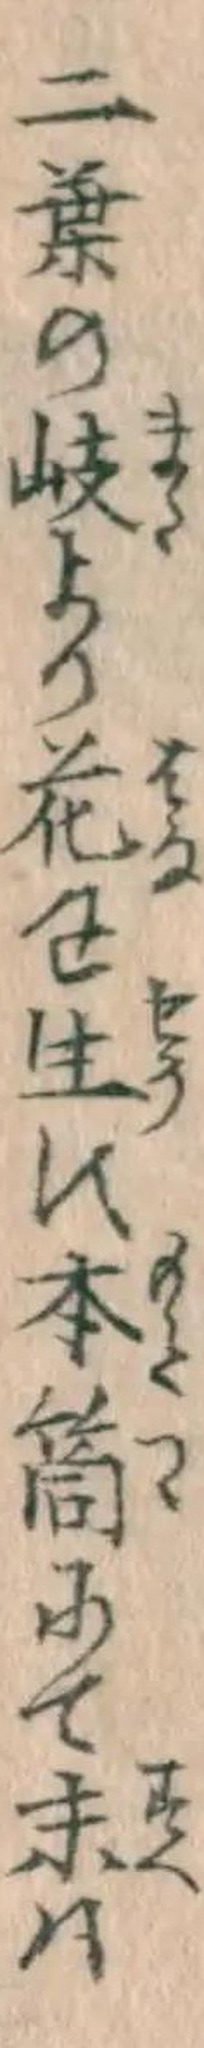二葉の岐より花を生す本筒にて末は
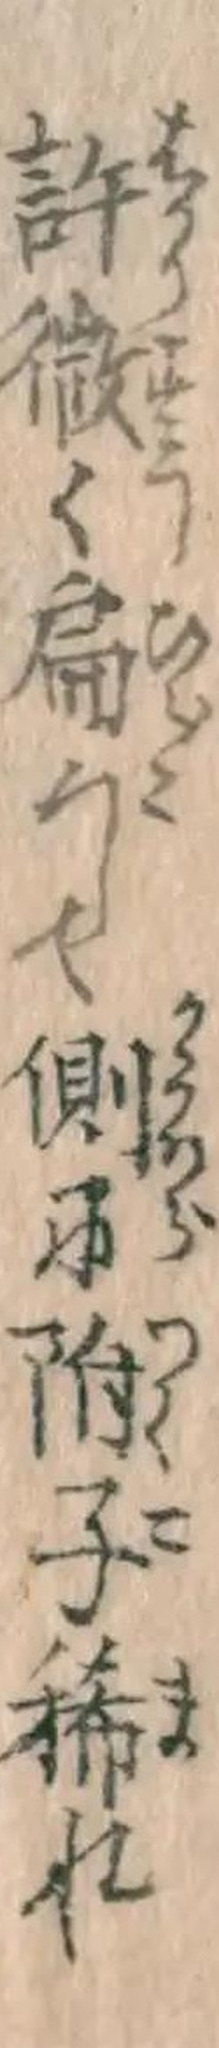許微く扁くして側に附子稀れ
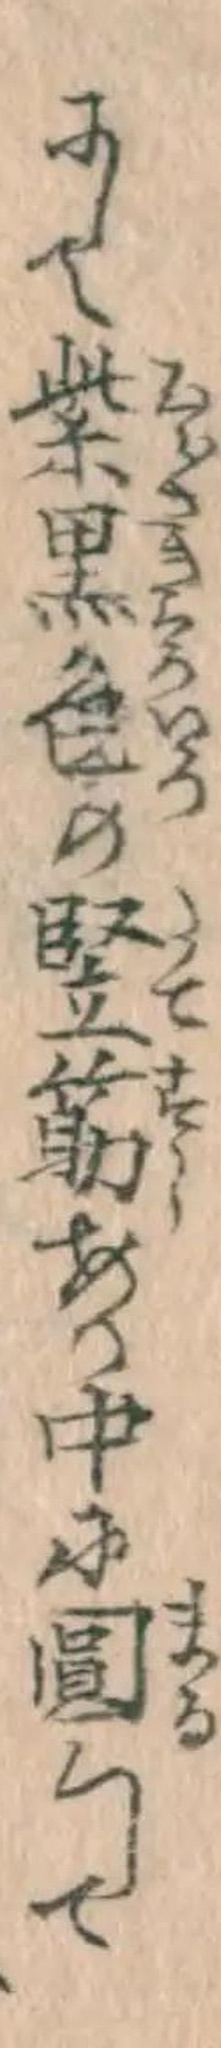にして紫黒色の竪筋あり中に円くして

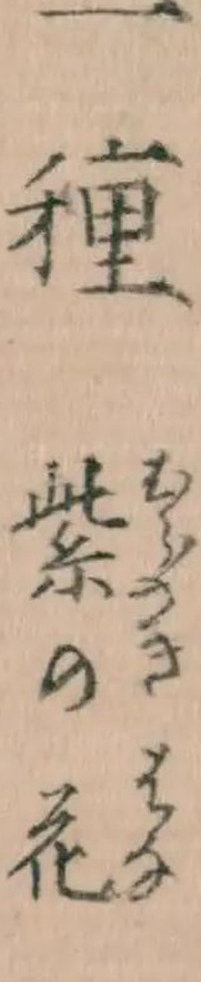一種紫の花

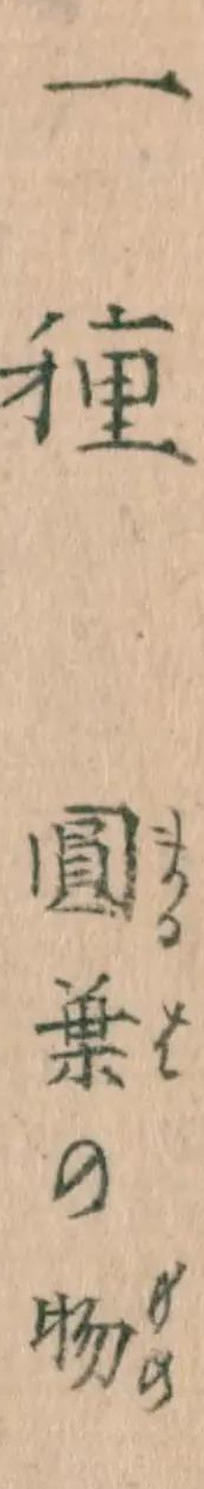一種円葉の物
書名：本草図譜. 巻22-24
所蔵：国立国会図書館 National Diet Library, JAPAN
